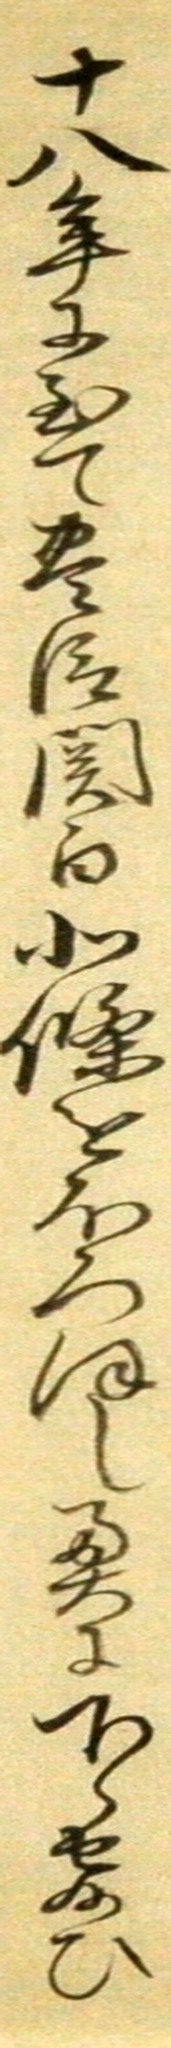十八年に至て豊臣関白北条をほろほし奥に下らせ給ひ

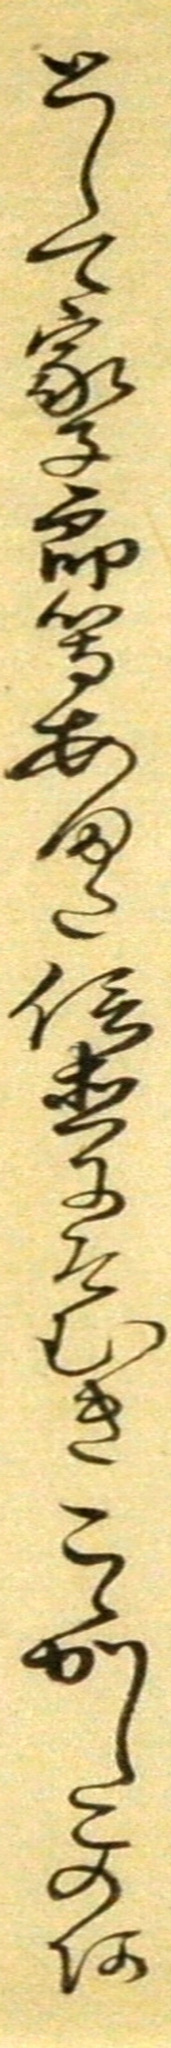として家子郎等あまた信直にそむきこゝかしこのあ
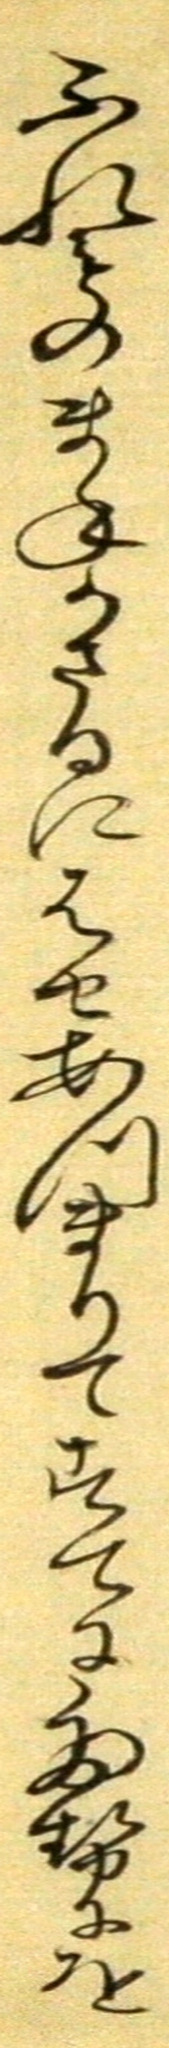ふれものまねかさるにはせあつまりてすてに多勢にを
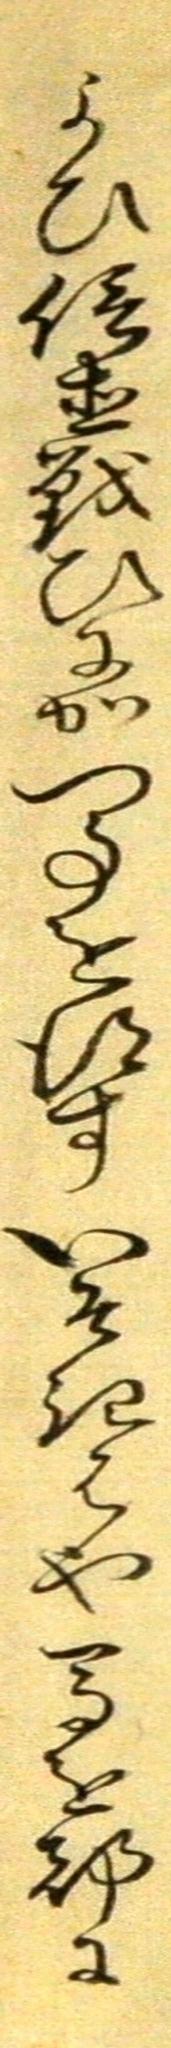よひ信直戦ひにかつ事を得すいそきはや馬を都に

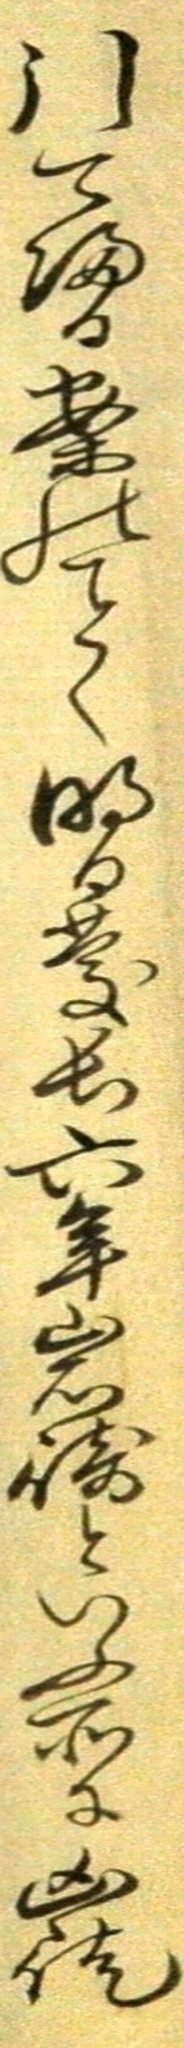引て帰る案のことく明る慶長六年岩崎といふ所に凶徒
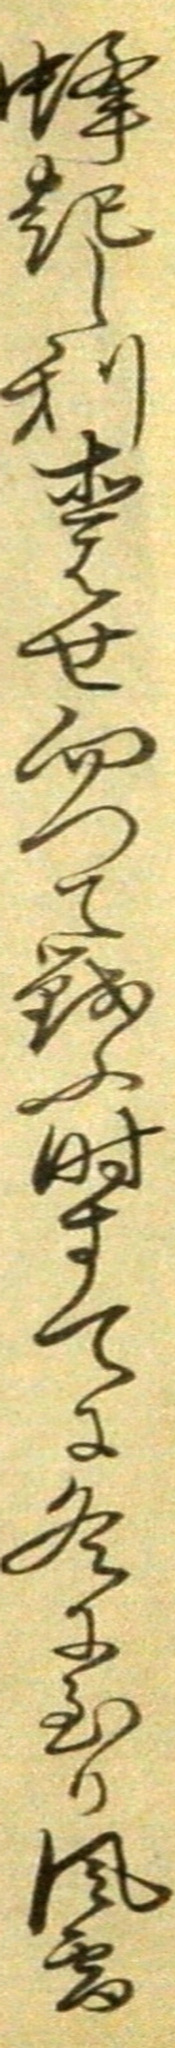蜂起し利直はせ向つて戦ふ時すてに冬に至り風雪
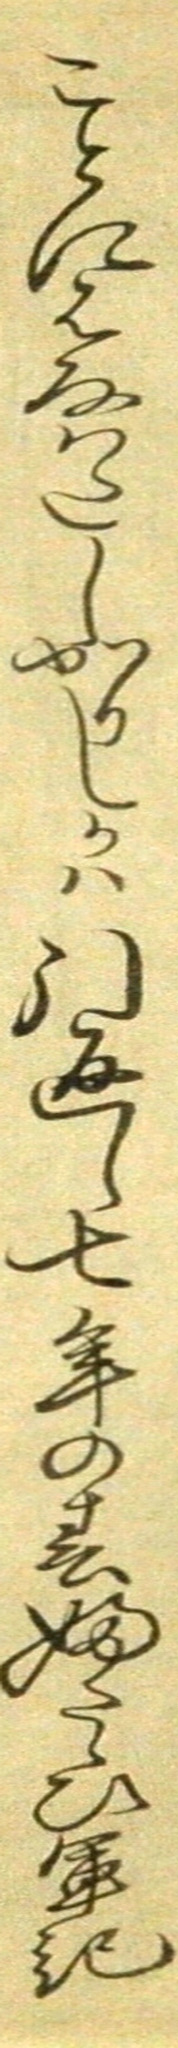ことにはなはたしかりしかは引返し七年の春ふたゝひ軍起
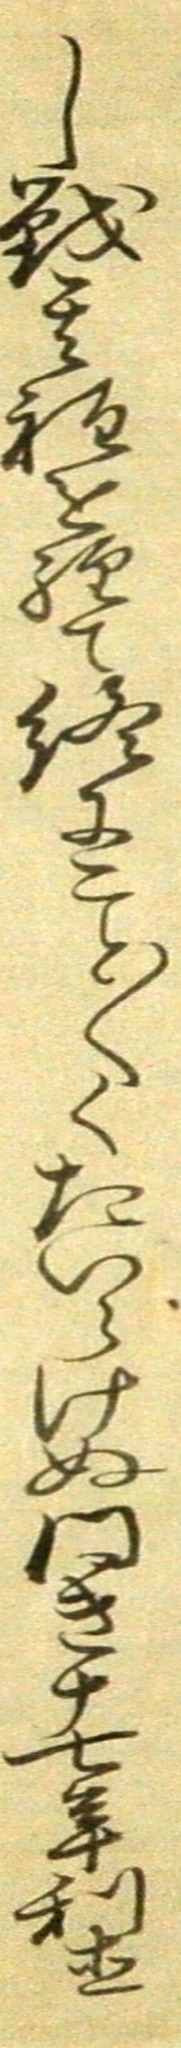し戦其程を経て終にこと〳〵くたいらけぬ同き十七年利直
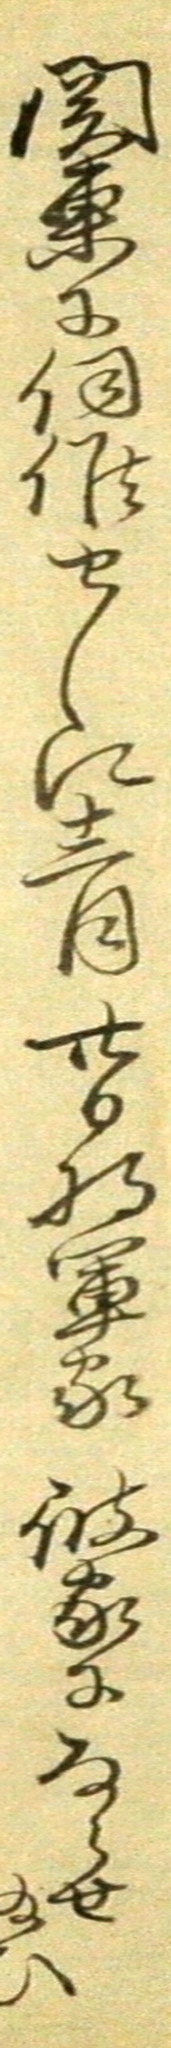関東に伺候せしに十二月廿日将軍家彼家にならせ給ひ
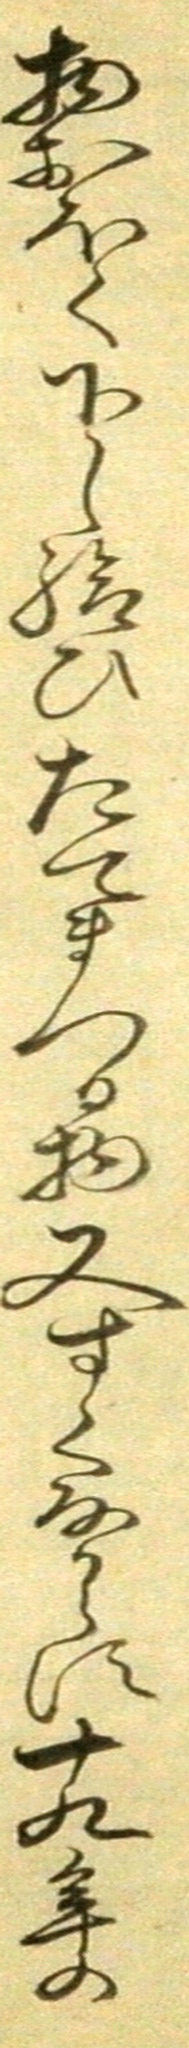物おほく下し給ひたてまつる物又すくなからす十九年の
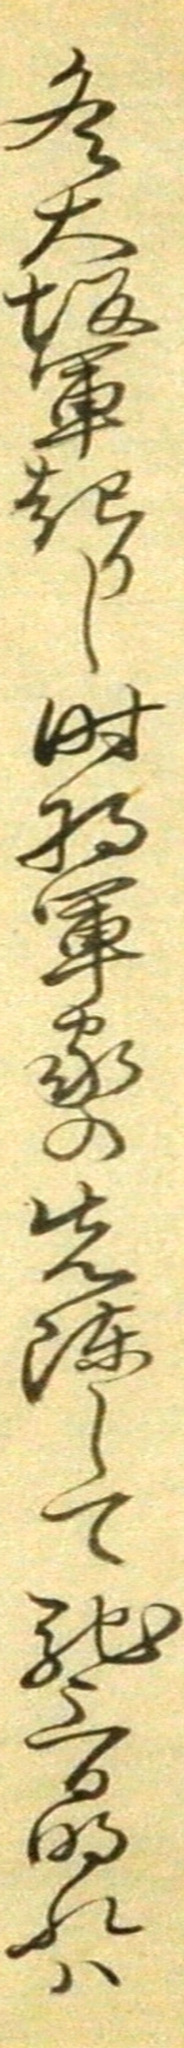冬大坂軍起りし時将軍家の先陣して馳上る明れは
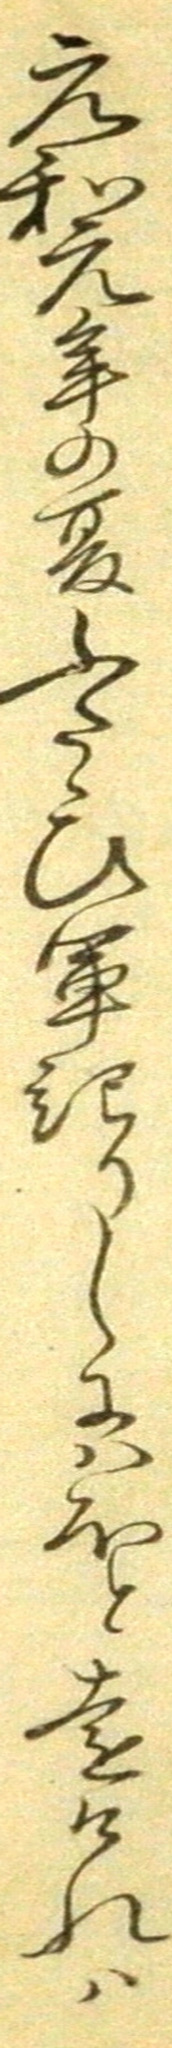元和元年の夏ふたゝひ軍起りしにはほと遠けれは
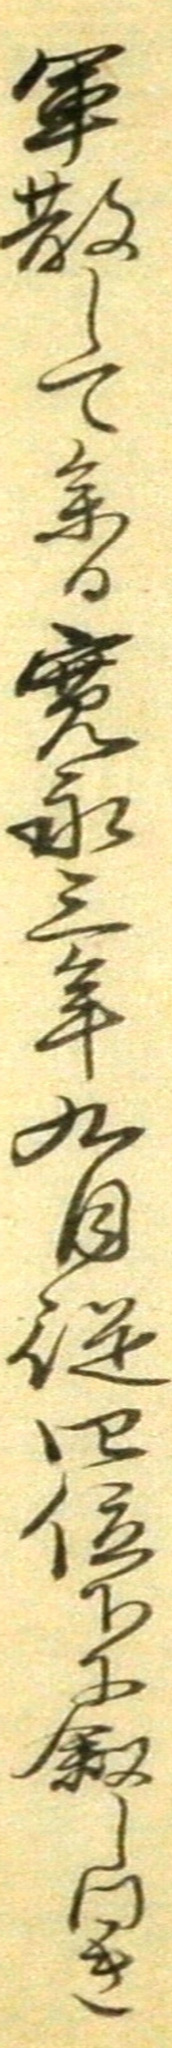軍散して参る寛永三年九月従四位下に叙し同き
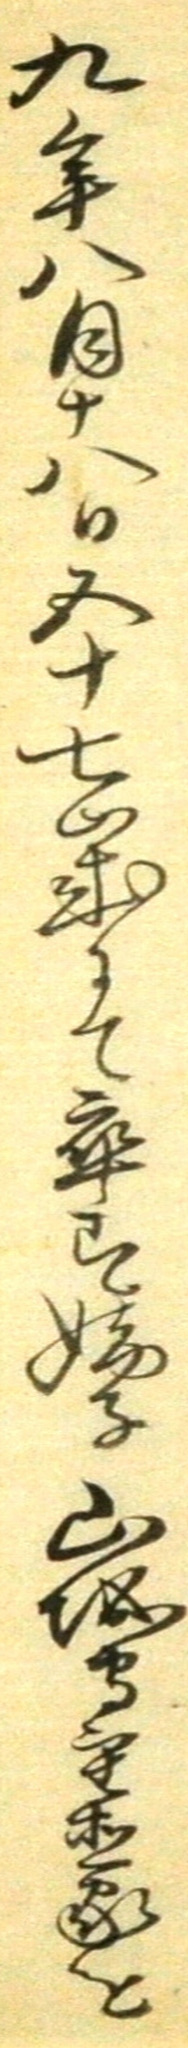九年八月十八日五十七歳にて卒す嫡子山城守重直家を
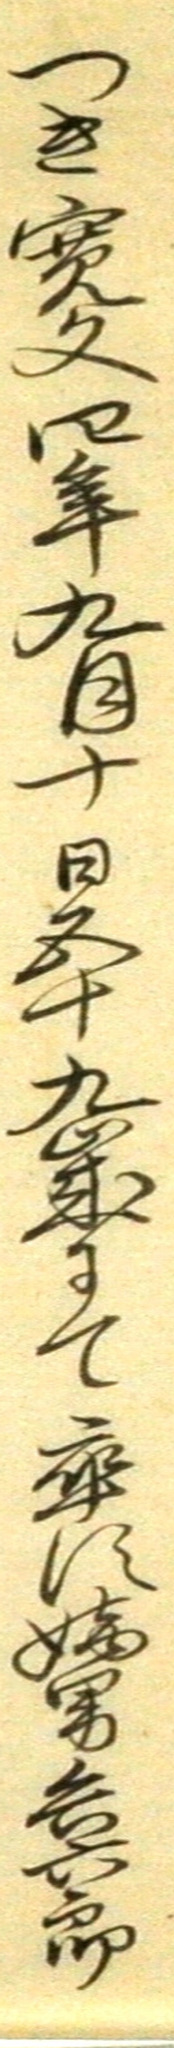つき寛文四年九月十日五十九歳にて卒す嫡男兵六郎
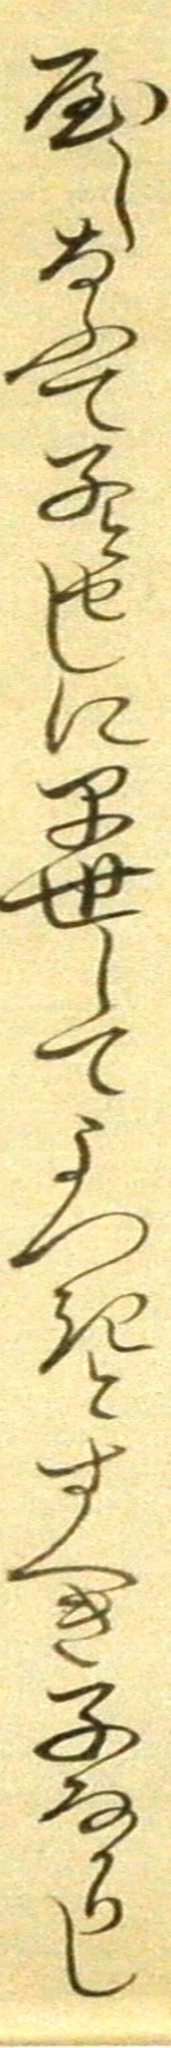やしなふて子とせしに早世してよつきとすへき子なかりし
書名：藩翰譜（九・下）
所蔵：伊那市立高遠町図書館・合同会社AMANE
